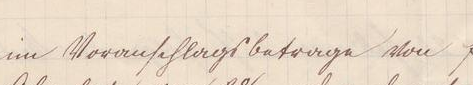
im Voranschlagsbetrage von
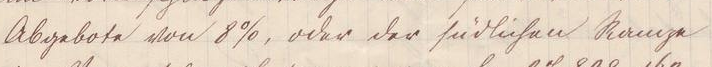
Abgebote von 8%, oder der südlichen Rampe
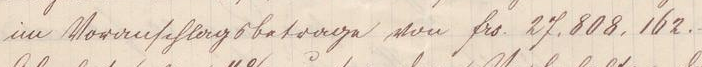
im Voranschlagsbetrage von frs. 27,808,162.–
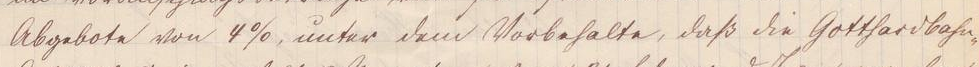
Abgebote von 4%, unter dem Vorbehalte, daß die Gotthardbahn-
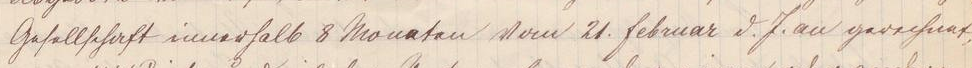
Gesellschaft innerhalb 8 Monaten vom 21. Februar d. J. an gerechnet,
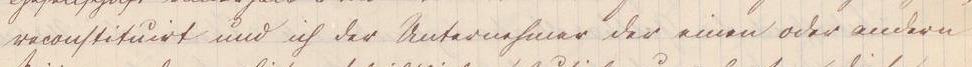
reconstituirt und ich der Unternehmer der einen oder andern
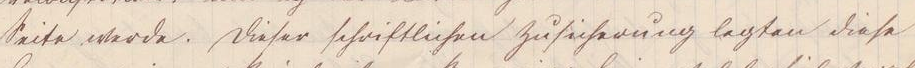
Seite werde. Dieser schriftlichen Zusicherung legten diese
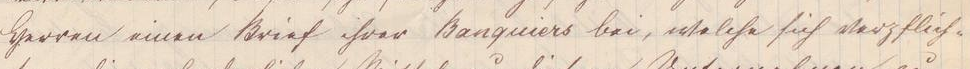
Herren einen Brief ihrer Banquiers bei, welche sich verpflich-
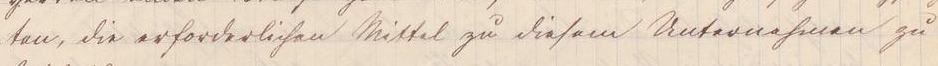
ten, die erforderlichen Mittel zu diesem Unternehmen zu
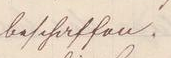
beschaffen.
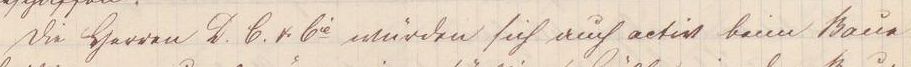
Die Herren D. C. & Cie würden sich auch activ beim Baue
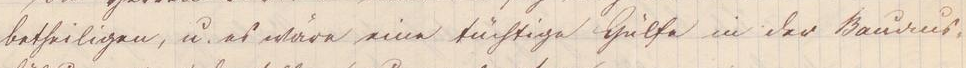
betheiligen, u. es wäre eine tüchtige Hülfe in der Bauaus-
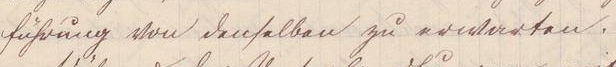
führung von denselben zu erwarten.
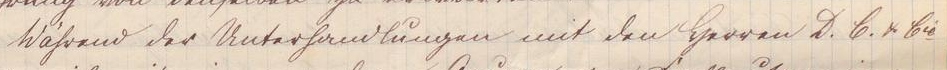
Während der Unterhandlungen mit den Herren D. C. & Cie
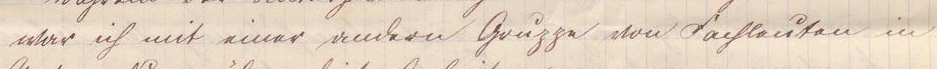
war ich mit einer andern Gruppe von Fachleuten in
